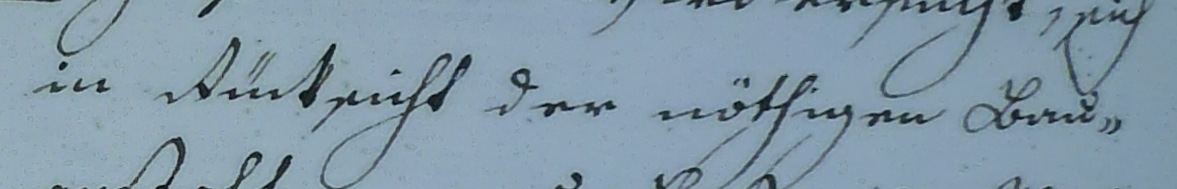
in Rücksicht der nöthigen Bau¬
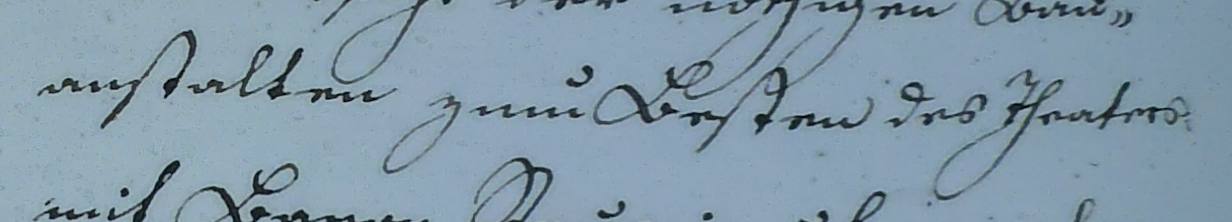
anstalten zum Besten des Theaters
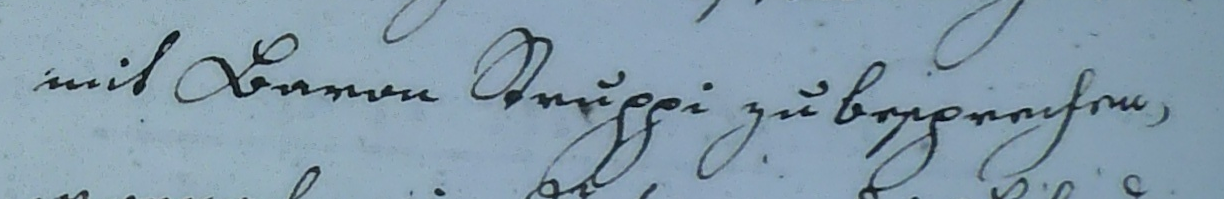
mit Baron Struppi zu besprechen,
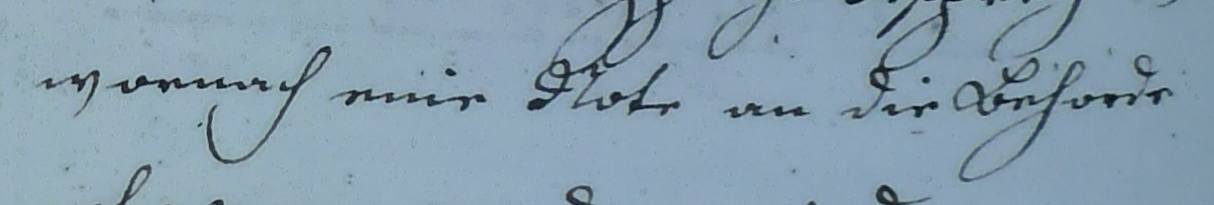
wornach eine Note an die Behorde
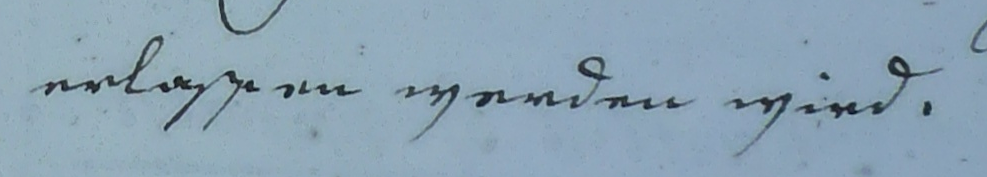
erlassen werden wird
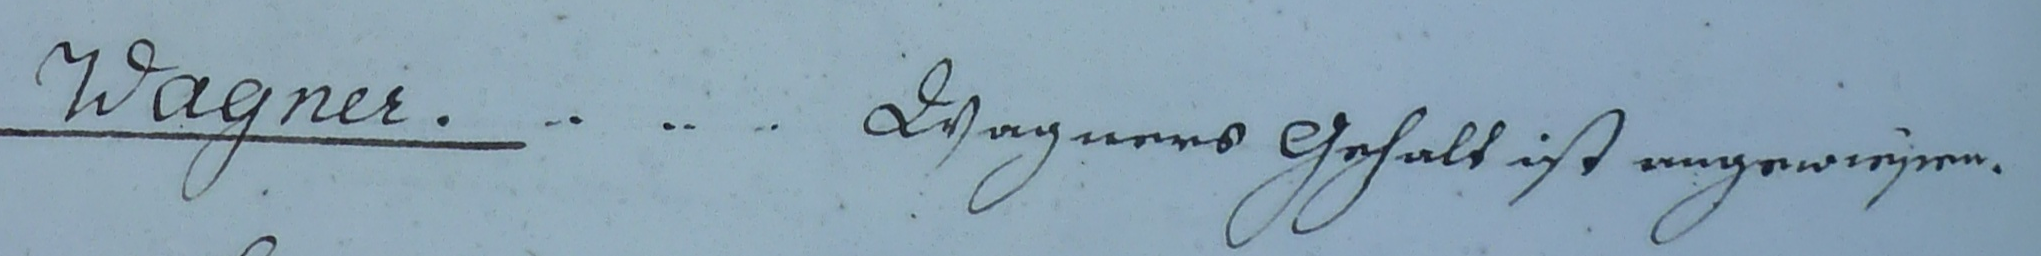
Wagner. .. .. .. Wagners Gehalt ist angewiesen.
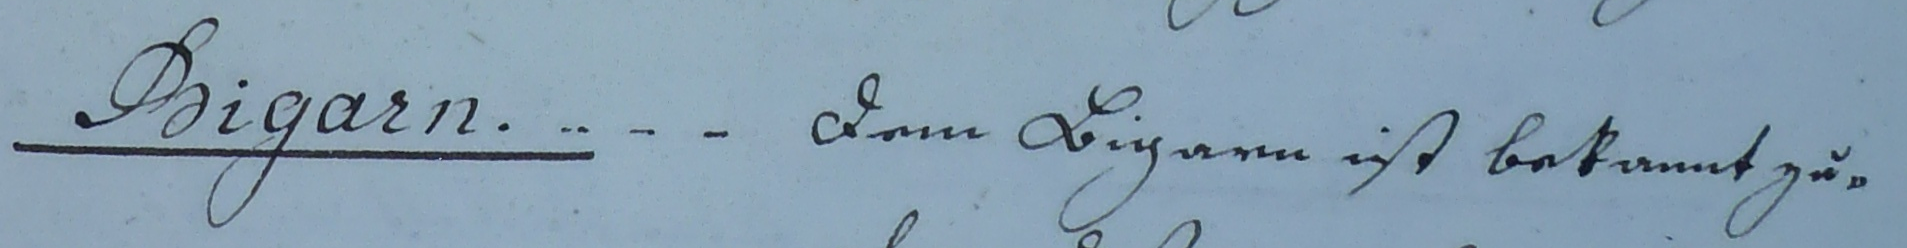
Bigarn. .. .. .. Dem Bigarn ist bekannt zu¬
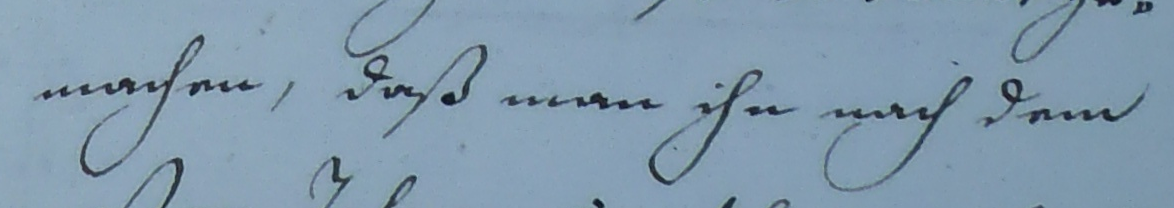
machen, daß man ihn nach dem
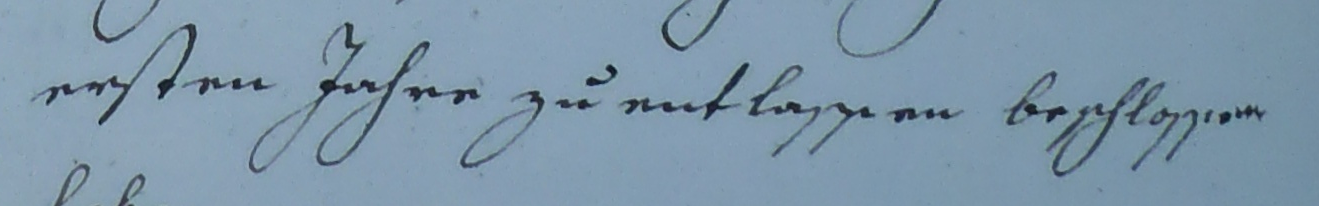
ersten Jahre zu entlassen beschlossen
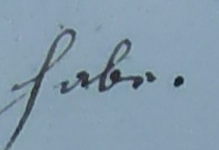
habe.
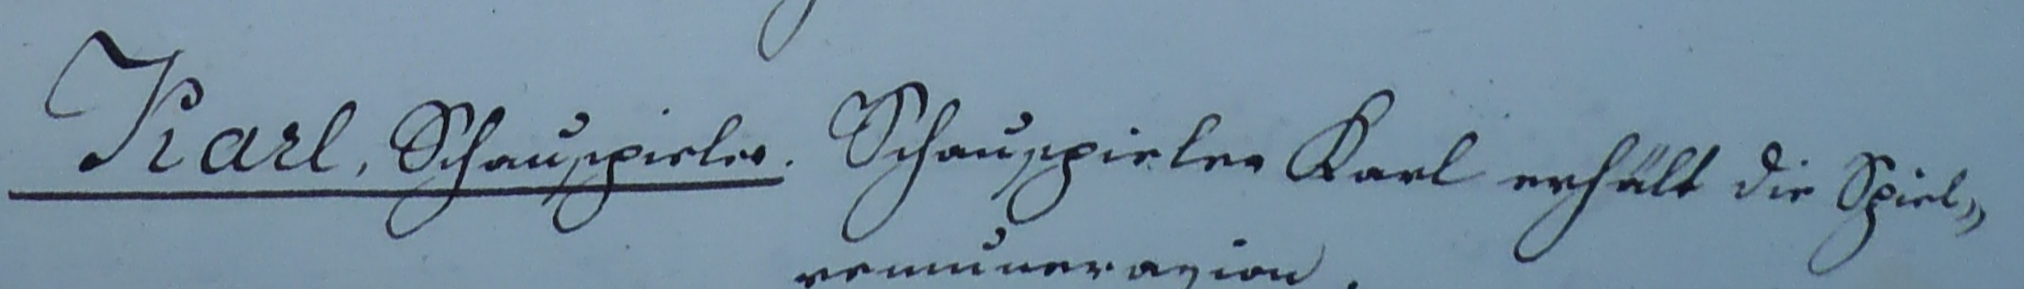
Karl, Schauspieler. Schauspieler Karl erhält die Spiel¬
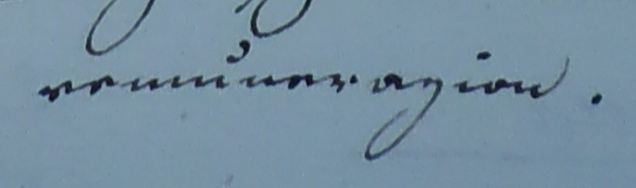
remunerazion.
